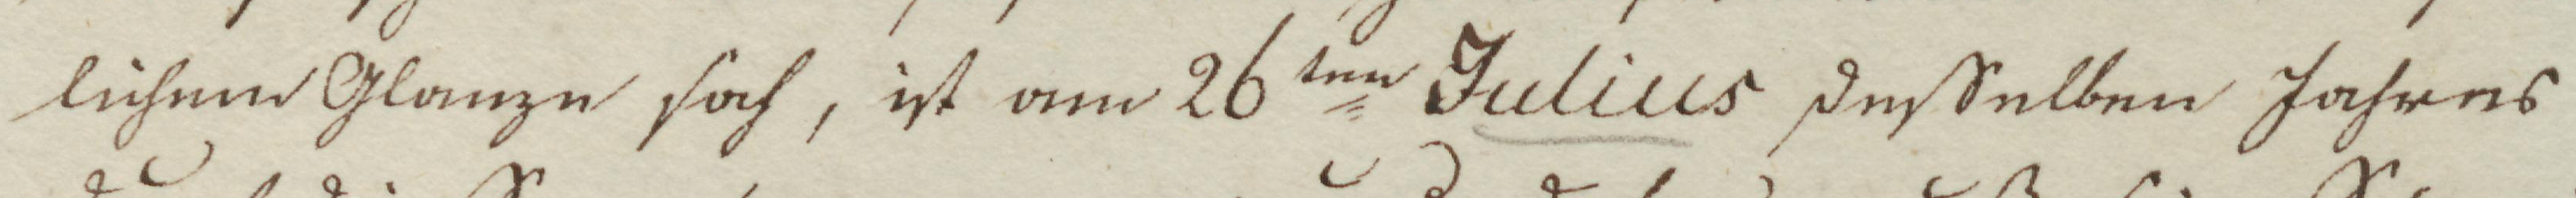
lichem Glanze sah, ist am 26ten Julius desselben Jahres
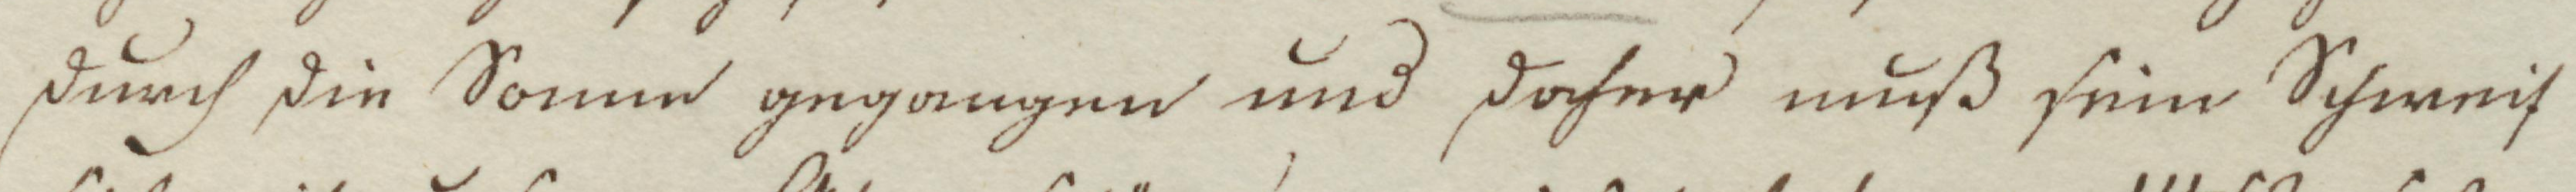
durch die Sonne gegangen und daher muß sein Schweif
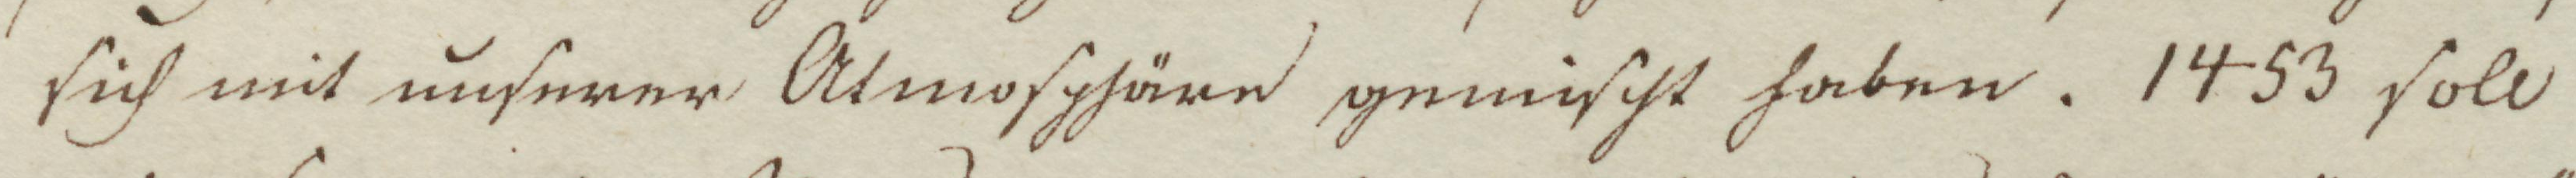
sich mit unserer Atmosphäre gemischt haben. 1453 soll
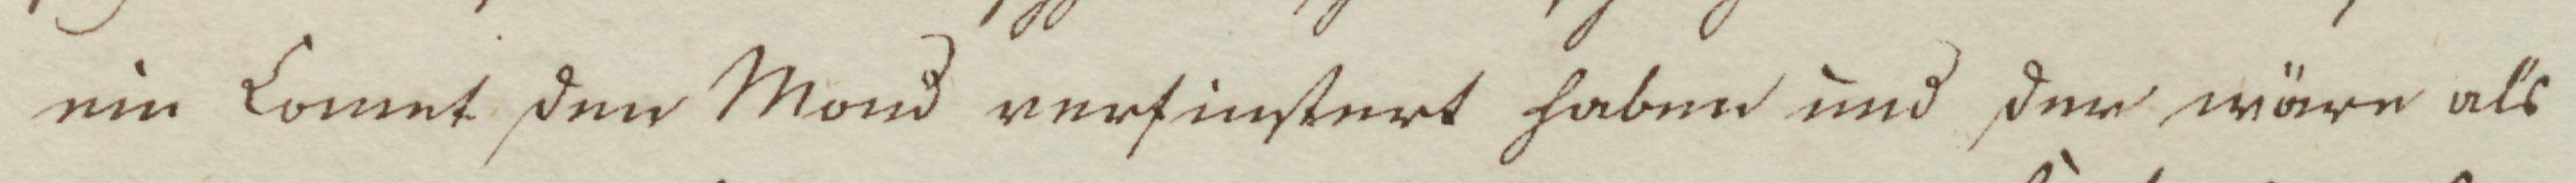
ein Comet den Mond verfinstert haben und der wäre als
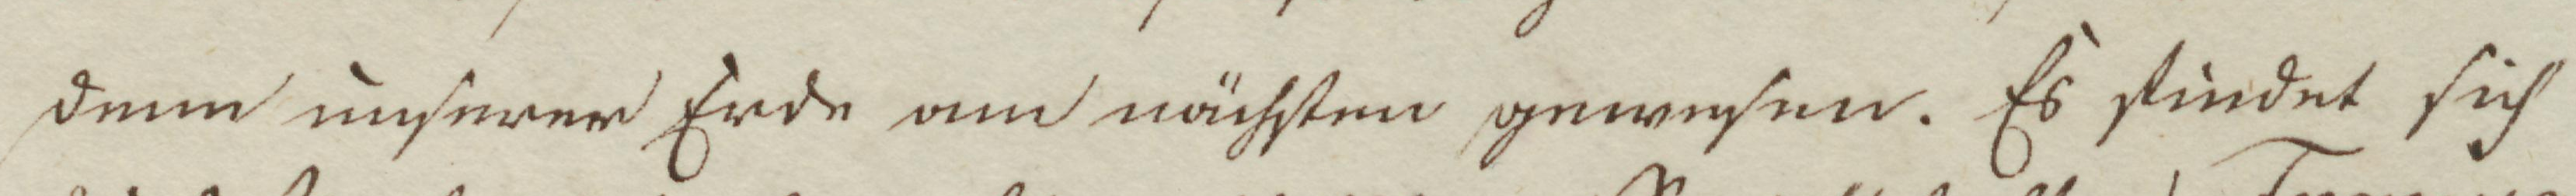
dann unserer Erde am nächsten gewesen. Es findet sich
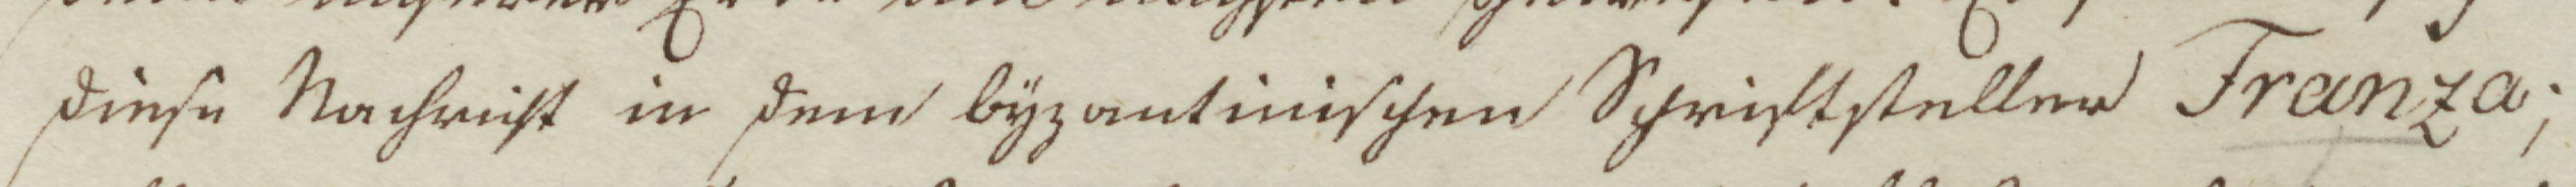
diese Nachricht in dem bÿzantinischen Schriftsteller Franza;
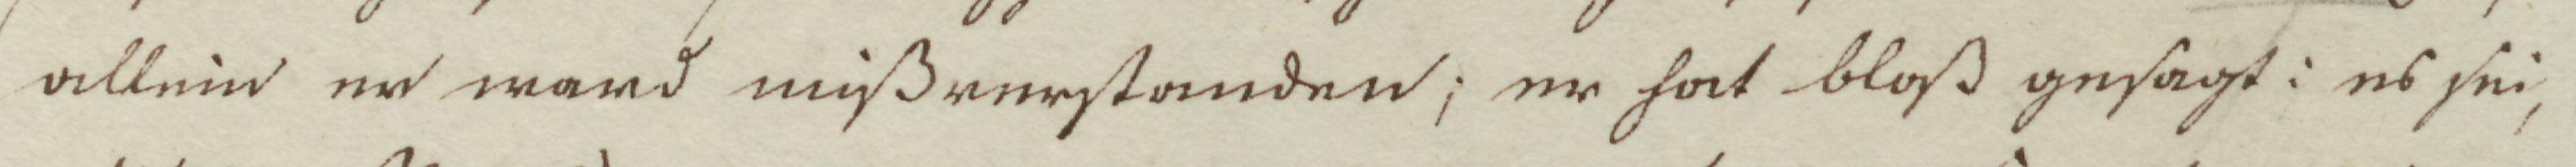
allein er ward mißverstanden; er hat bloß gesagt: es sei,
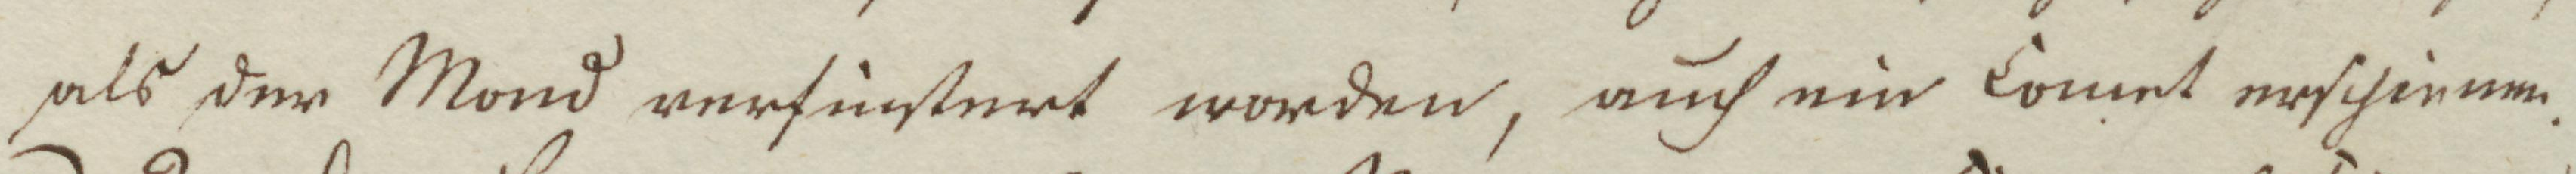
als der Mond verfinstert worden, auch ein Comet erschienen.
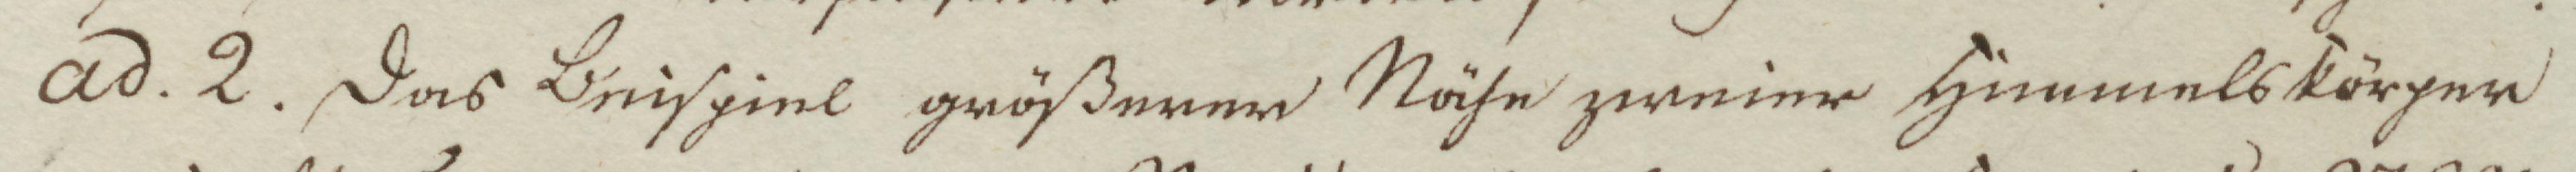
ad. 2. Das Beispiel größerer Nähe zweier Himmelskörper
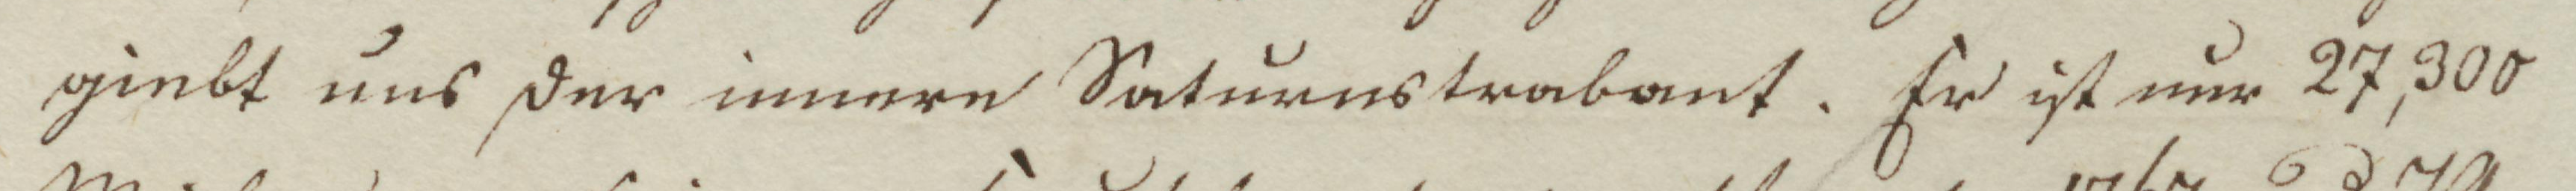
giebt uns der innere Saturnstrabant. Er ist nur 27,300
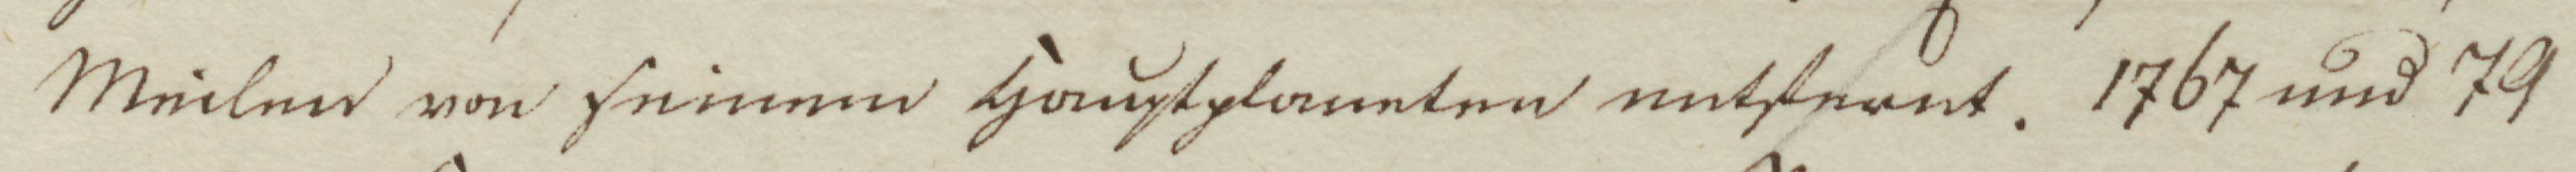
Meilen von seinem Hauptplaneten entfernt. 1767 und 79
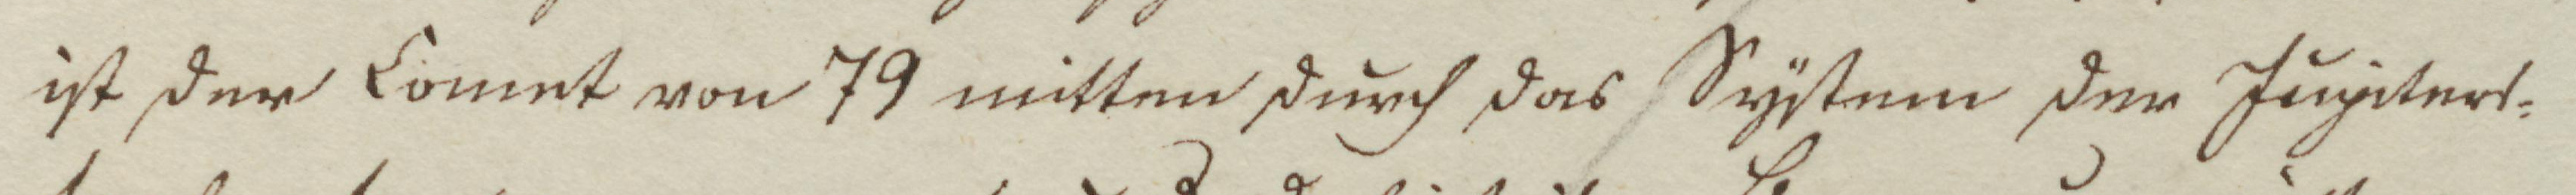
ist der Comet von 79 mitten durch das Sÿstem der Jupiter-
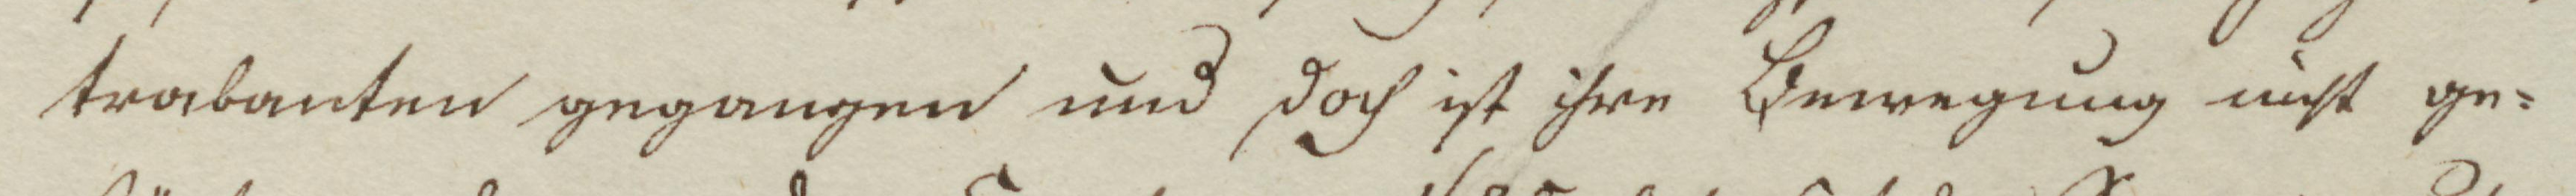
trabanten gegangen und doch ist ihre Bewegung nicht ge-
